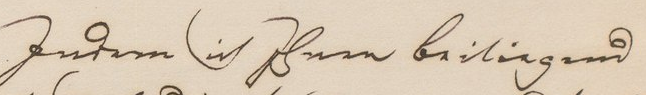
Indem ich Ihnen beiligend
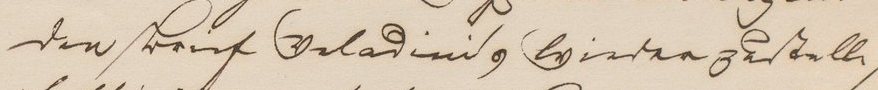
den Brief Veladinis wieder zustelle,
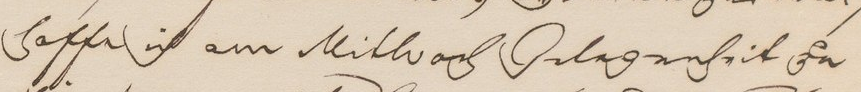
hoffe ich am Mittwoch Gelegenheit zu
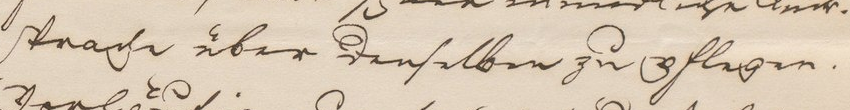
sprache über denselben zu pflegen.
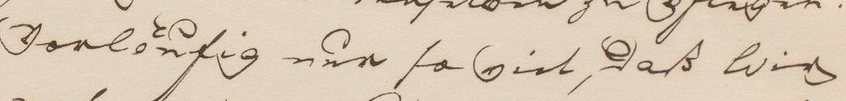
Vorläufig nur so viel, daß wir
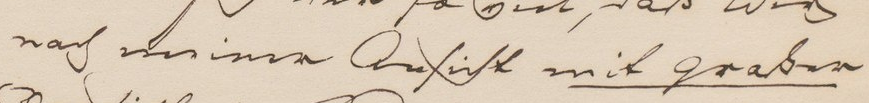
nach meiner Ansicht mit großer
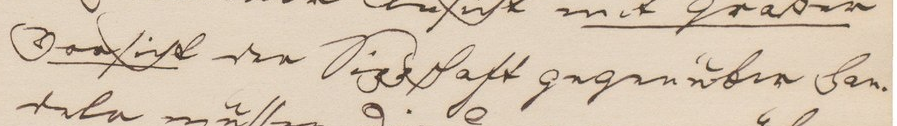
Vorsicht der Sippschaft gegenüber han-
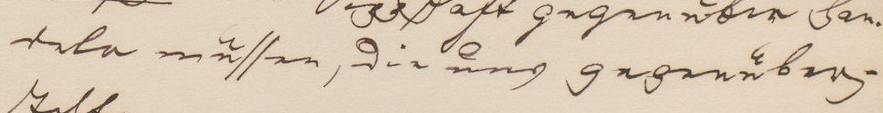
deln müssen, die uns gegenüber-
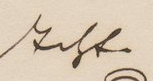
steht.
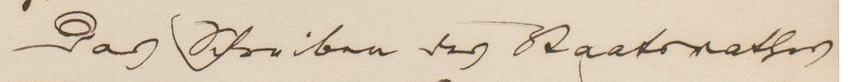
Das Schreiben des Staatsrathes
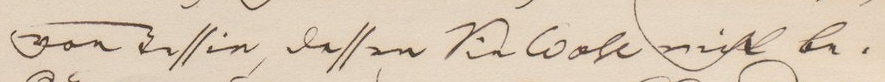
von Tessin, dessen Sie wohl nicht be-
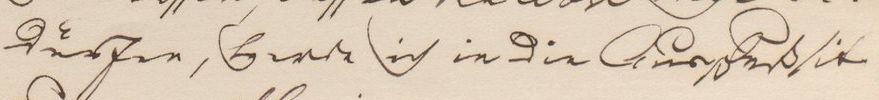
dürfen, werde ich in die Ausschußsit-
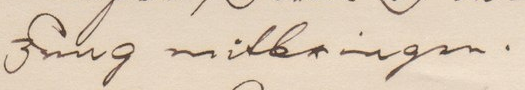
zung mitbringen.
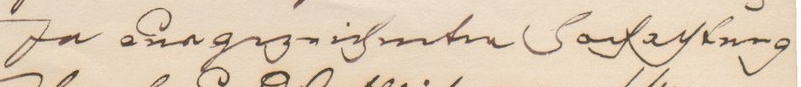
In ausgezeichneter Hochachtung
